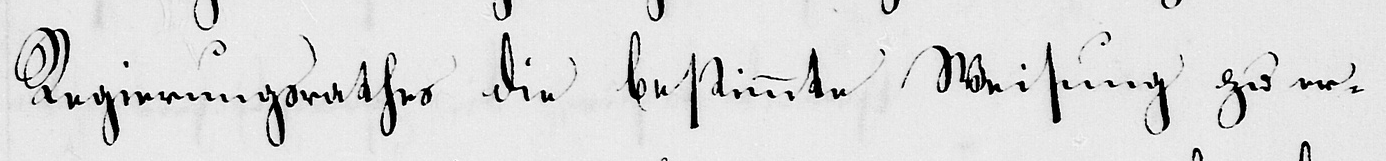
Regierungsrathes die bestimmte Weisung zu er¬
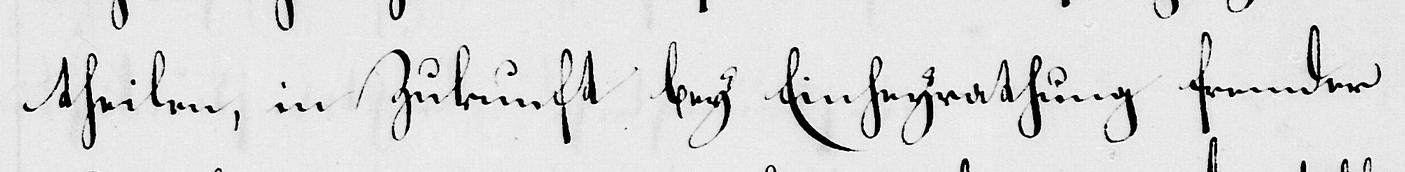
theilen, in Zukunft bey Einheyrathung fremder
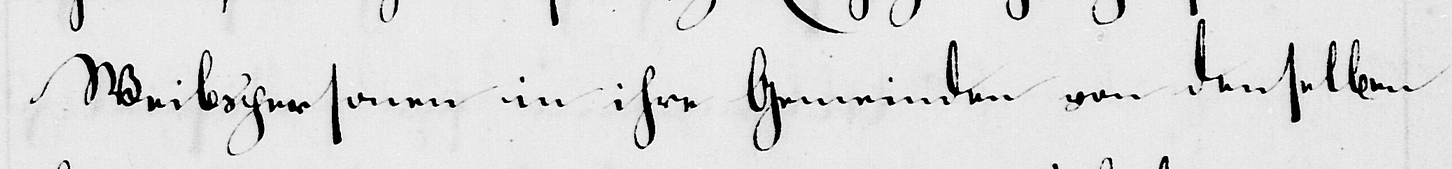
Weibspersonen in ihre Gemeinden von derselben
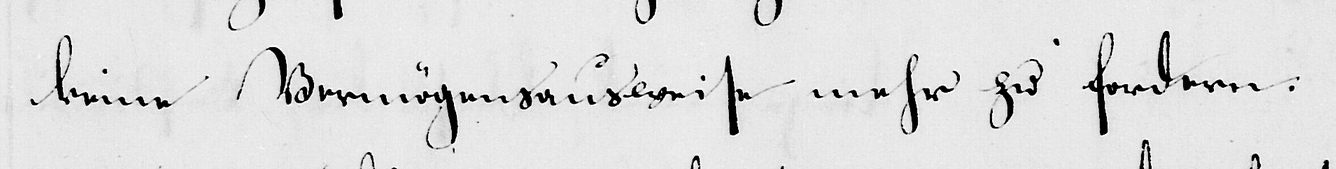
keine Vermögensausweise mehr zu fordern.
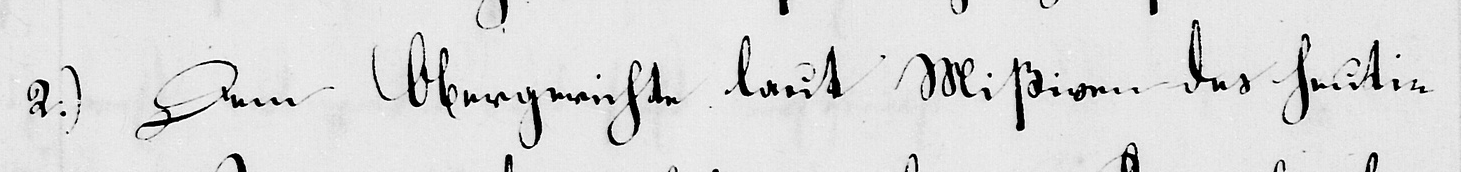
2.) Dem Obergerichte laut Mißiven des heuti¬
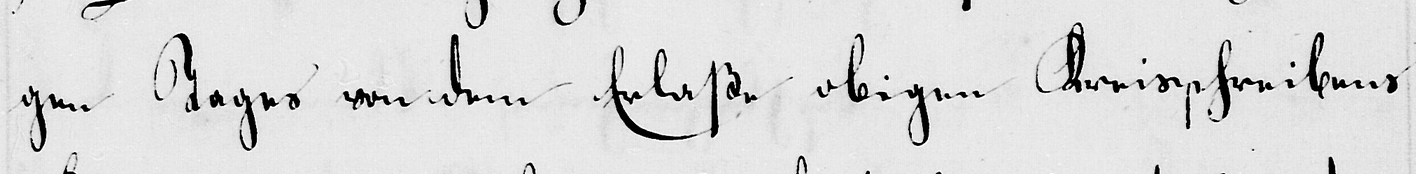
gen Tages von dem Erlaße obigen Kreisschreibens
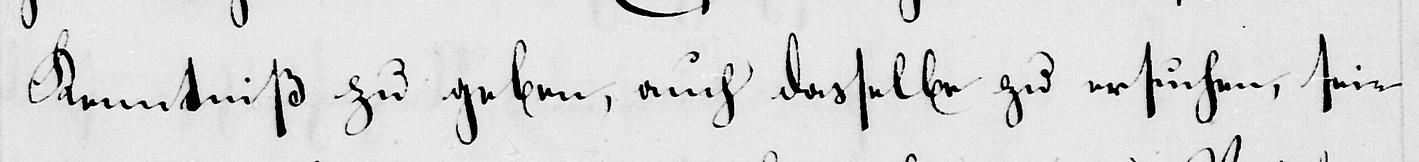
Kenntniß zu geben, auch dasselbe zu ersuchen, sei¬
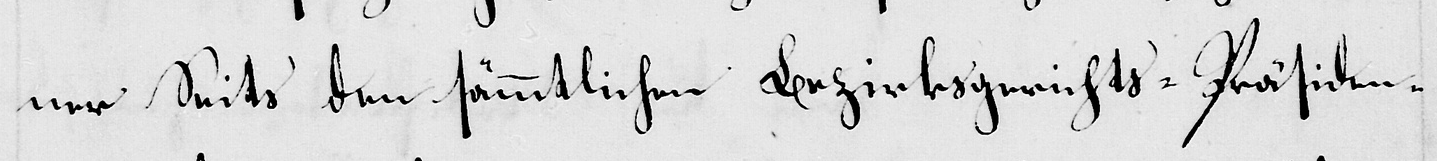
ner Seits den sämmtlichen Bezirksgerichts-Präsiden¬
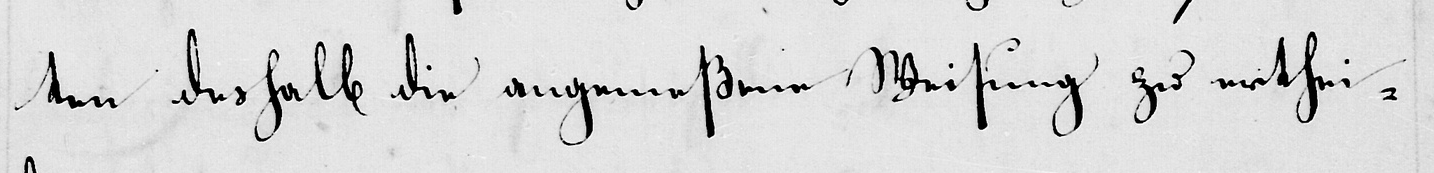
ten deshalb die angemeßene Weisung zu erthei¬
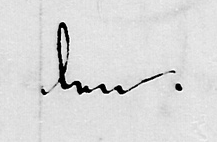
len.
